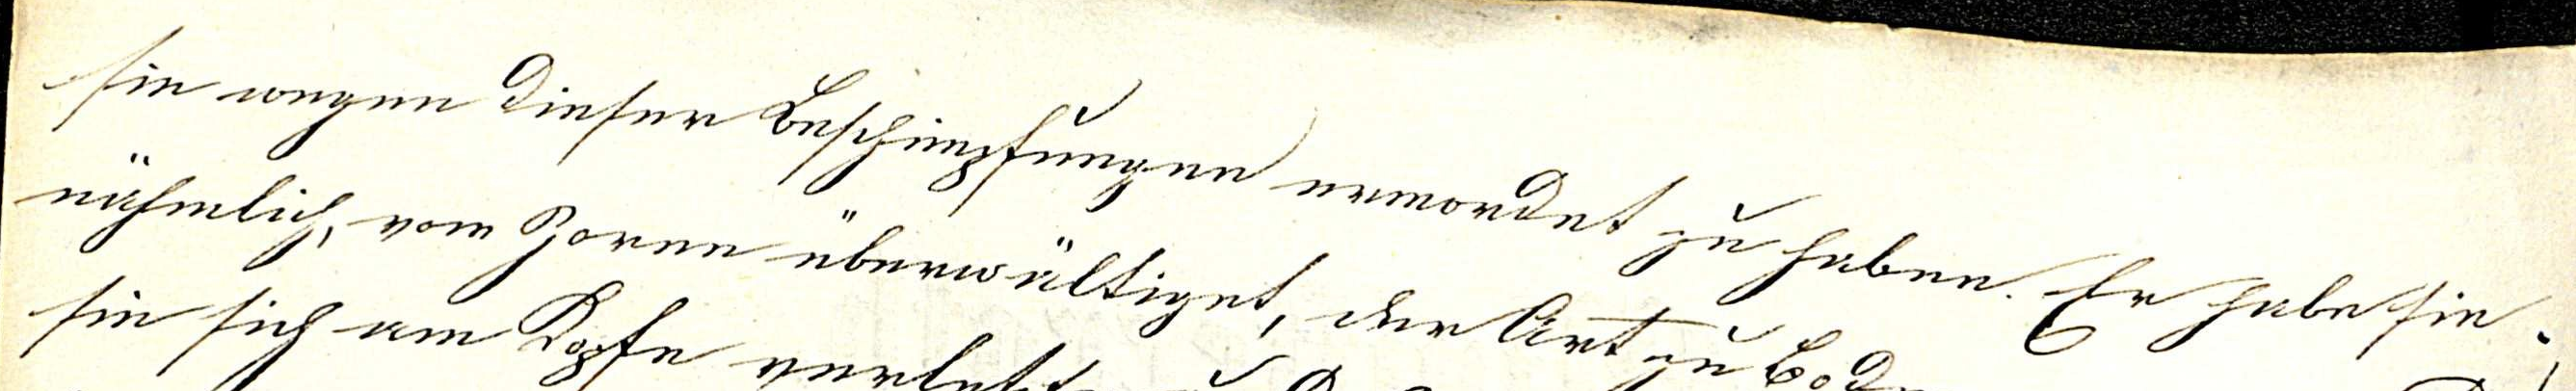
sie wegen dieser Beschimpfungen ermordet zu haben. Er habe sie
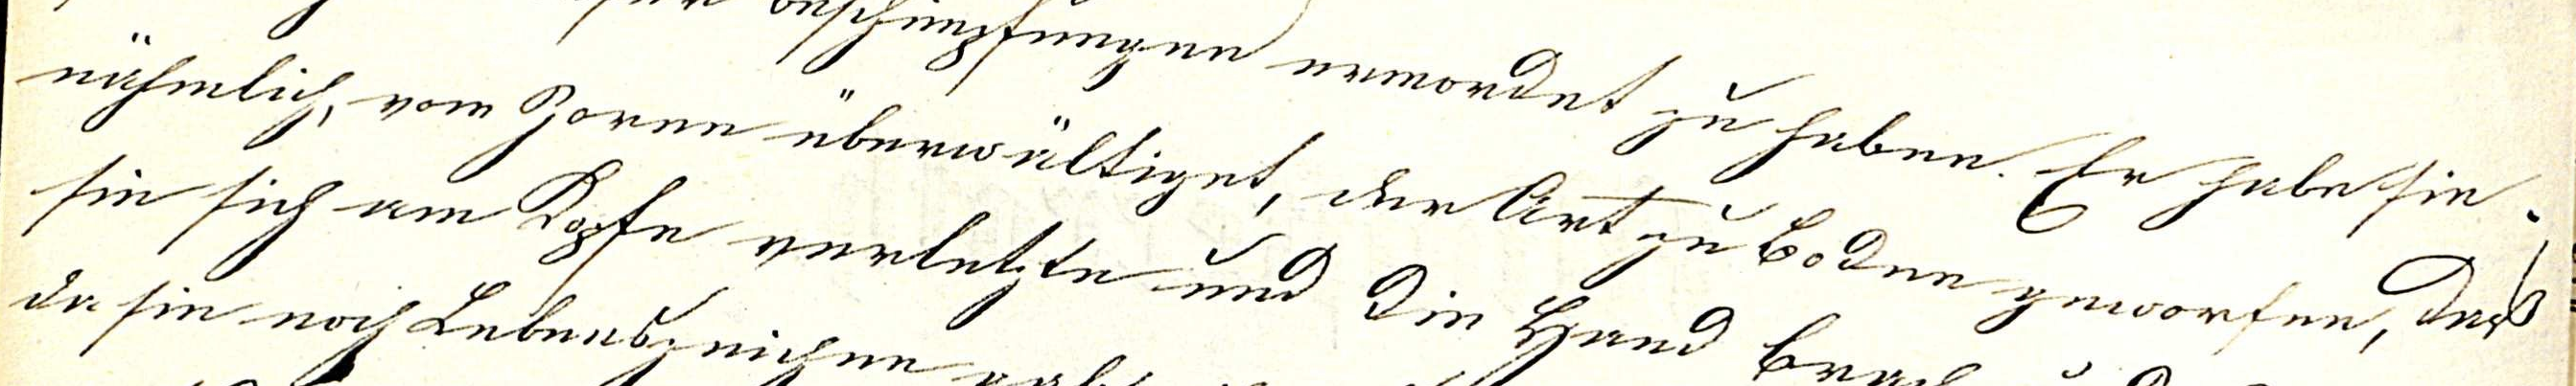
nämlich, vom Zorne überwältiget, der Art zu Boden geworfen, daß
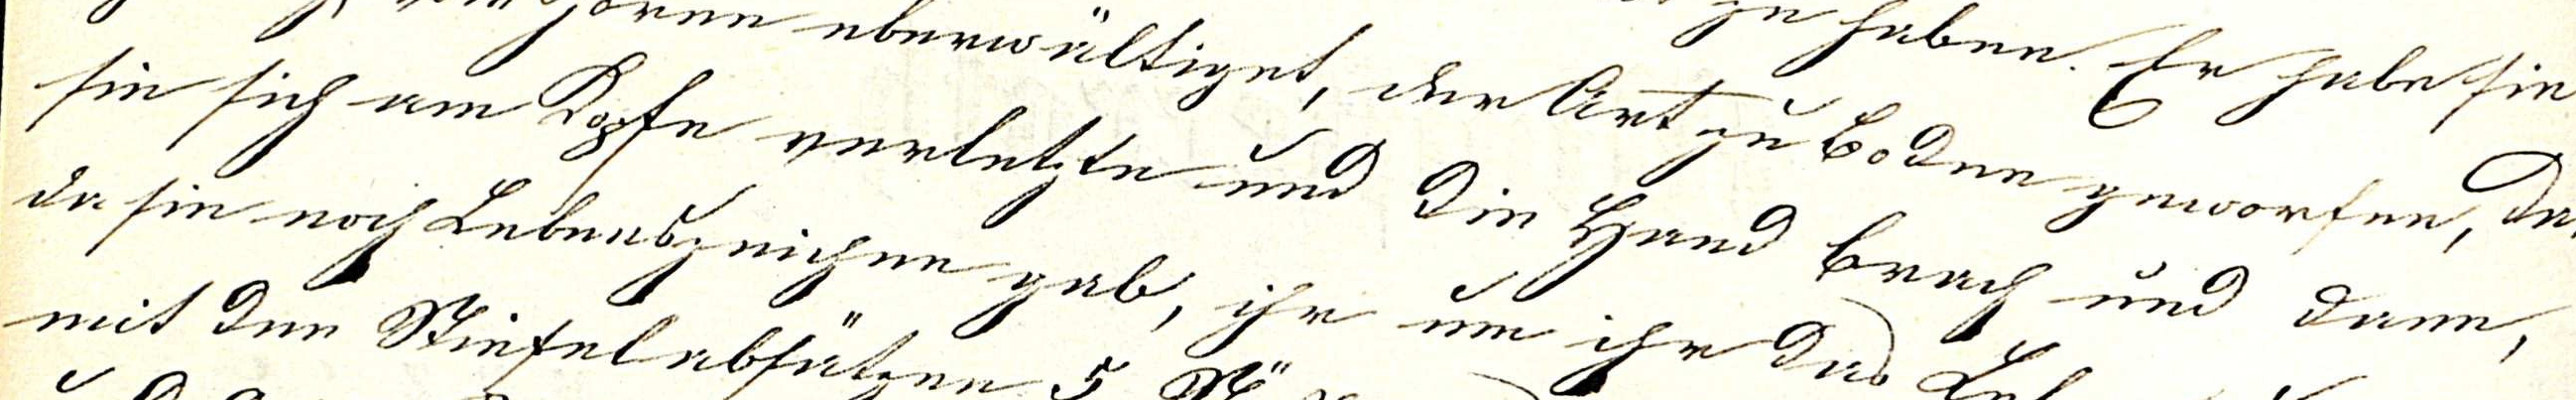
sie sich am Kopfe verletzte und die Hand brach und dann,
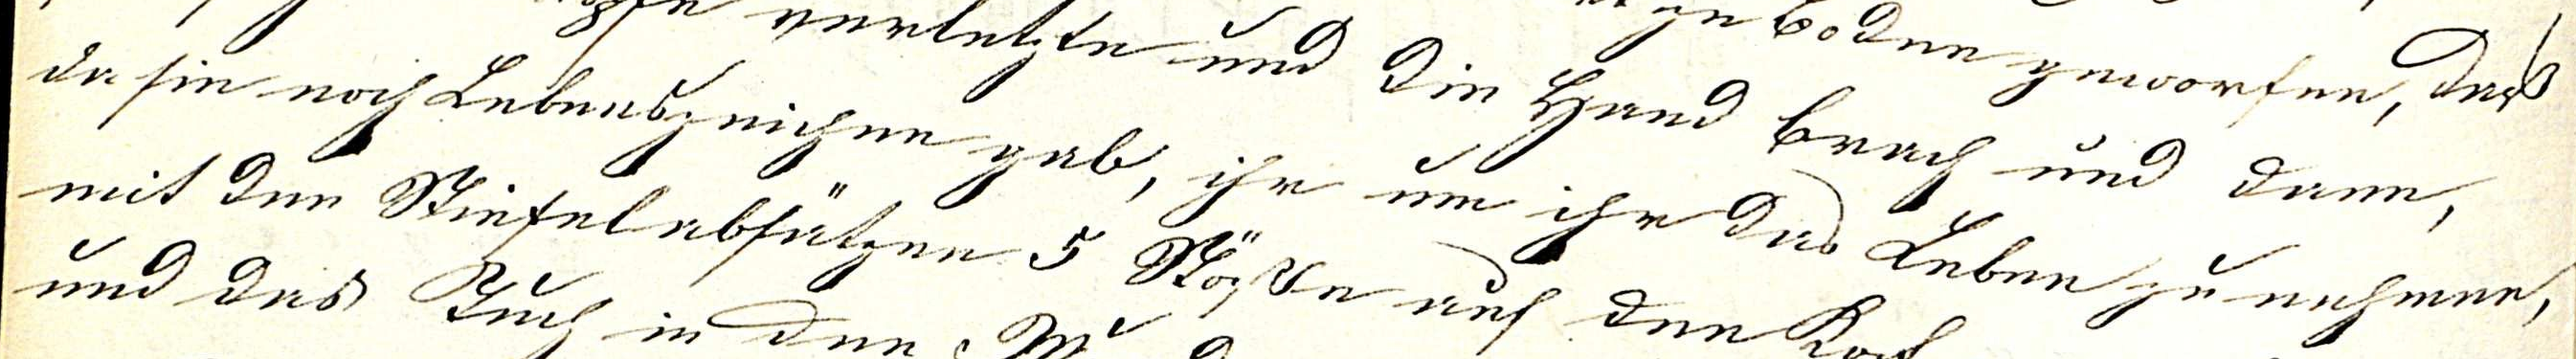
da sie noch Lebenszeichen gab, ihr um ihr das Leben zu nehmen,
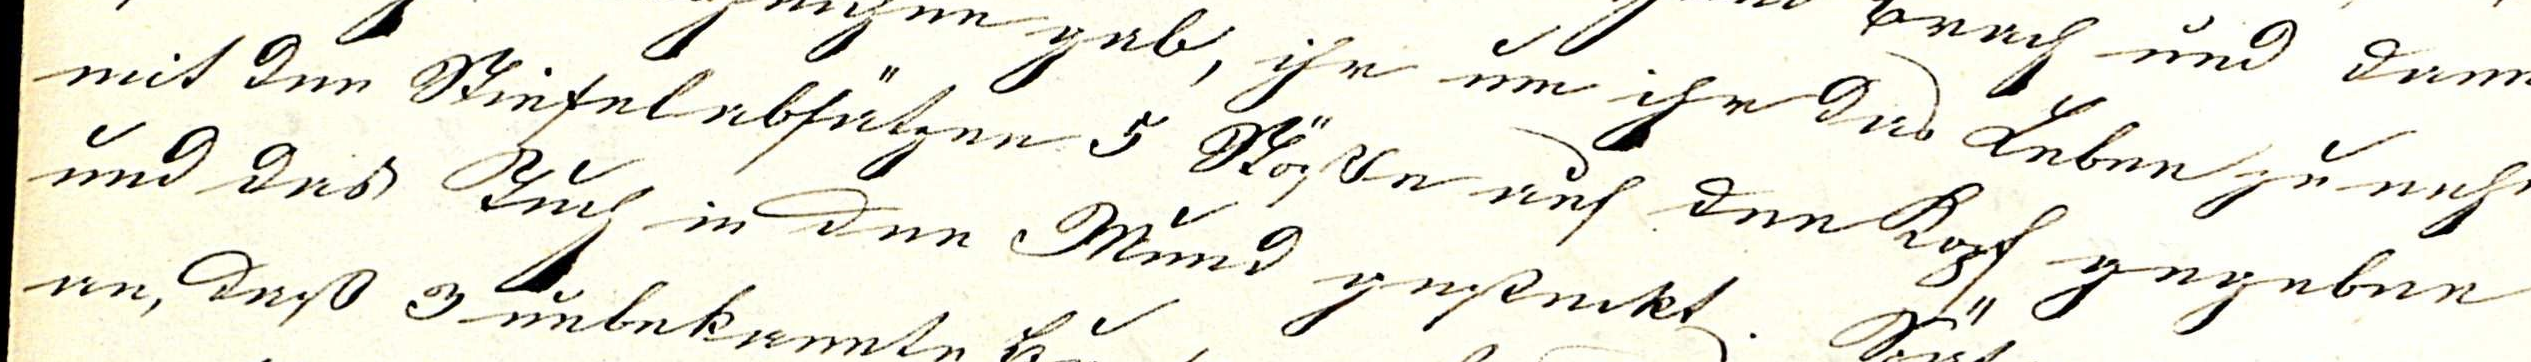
mit den Stiefelabsätzen 5 Stöße auf den Kopf gegeben
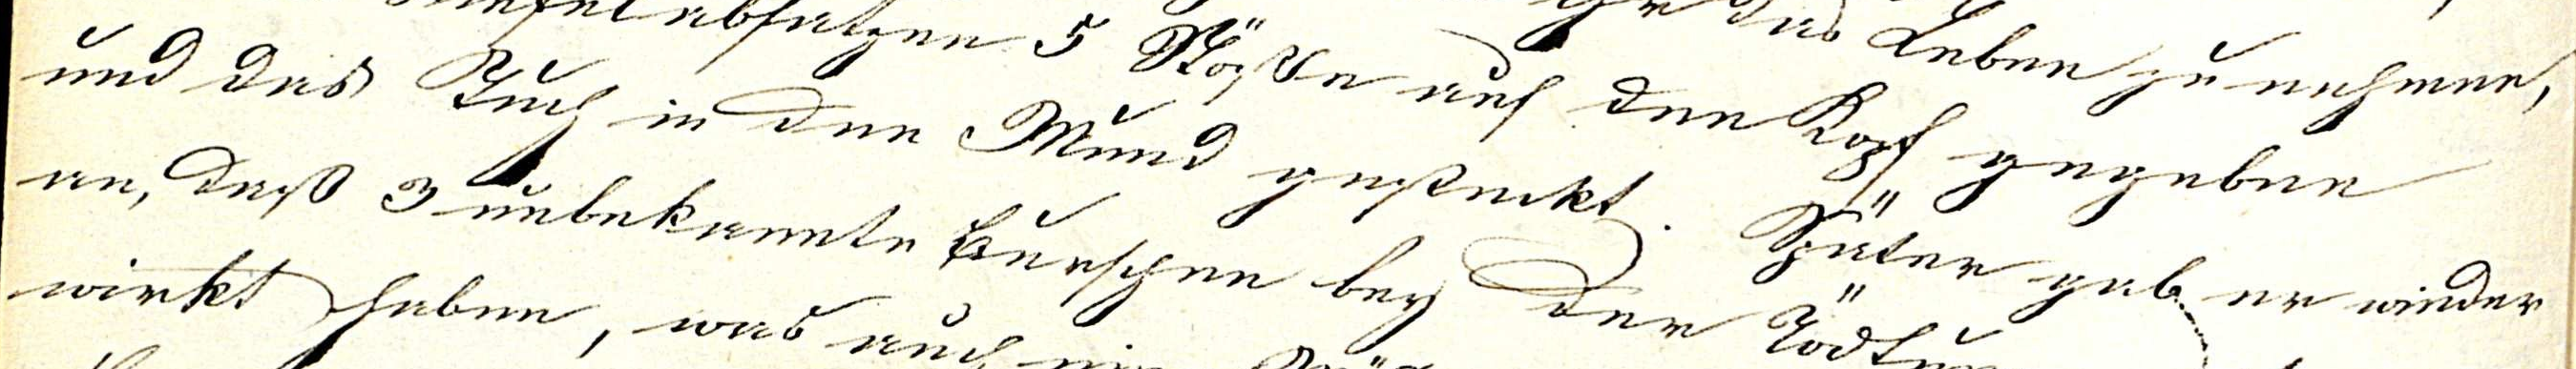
und das Tuch in den Mund gesteckt. Später gab er wieder
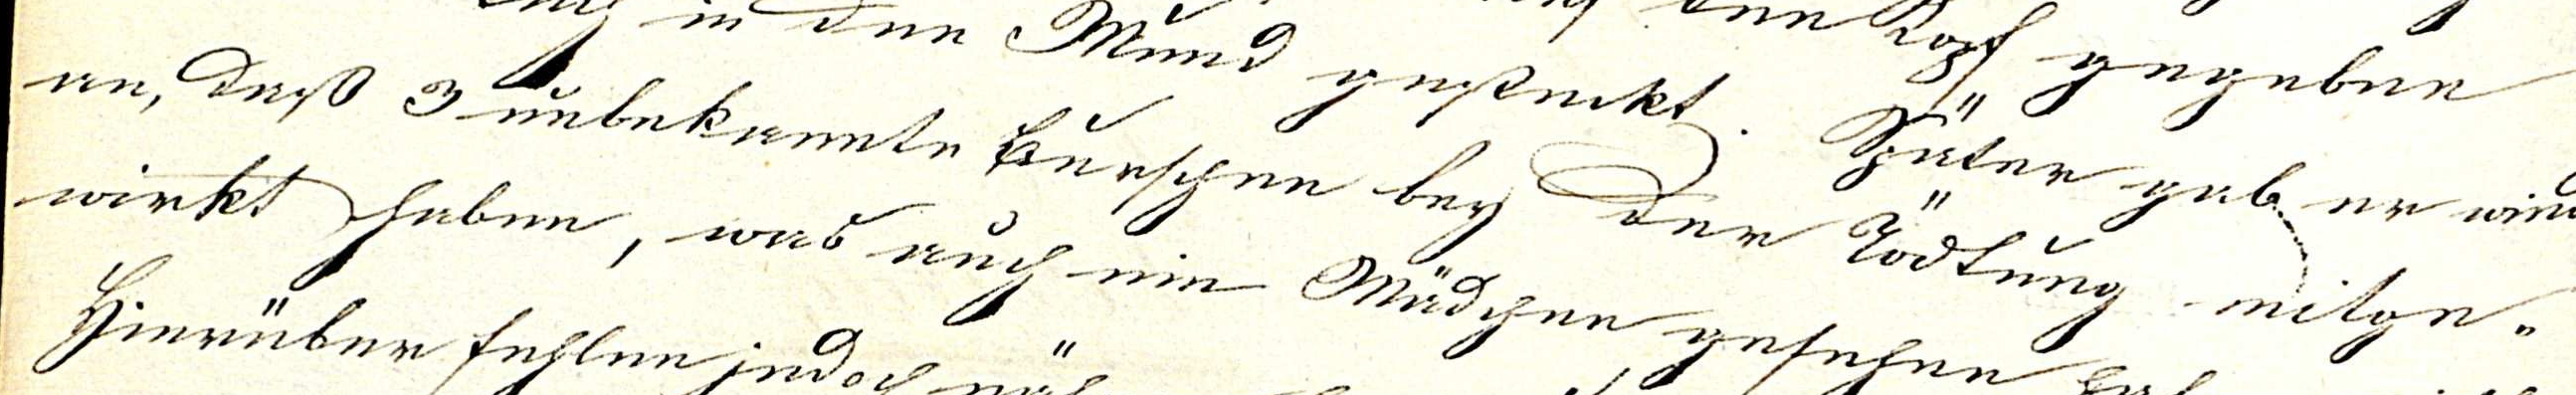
an, daß 3 unbekannte Burschen bey der Tödtung mitge¬
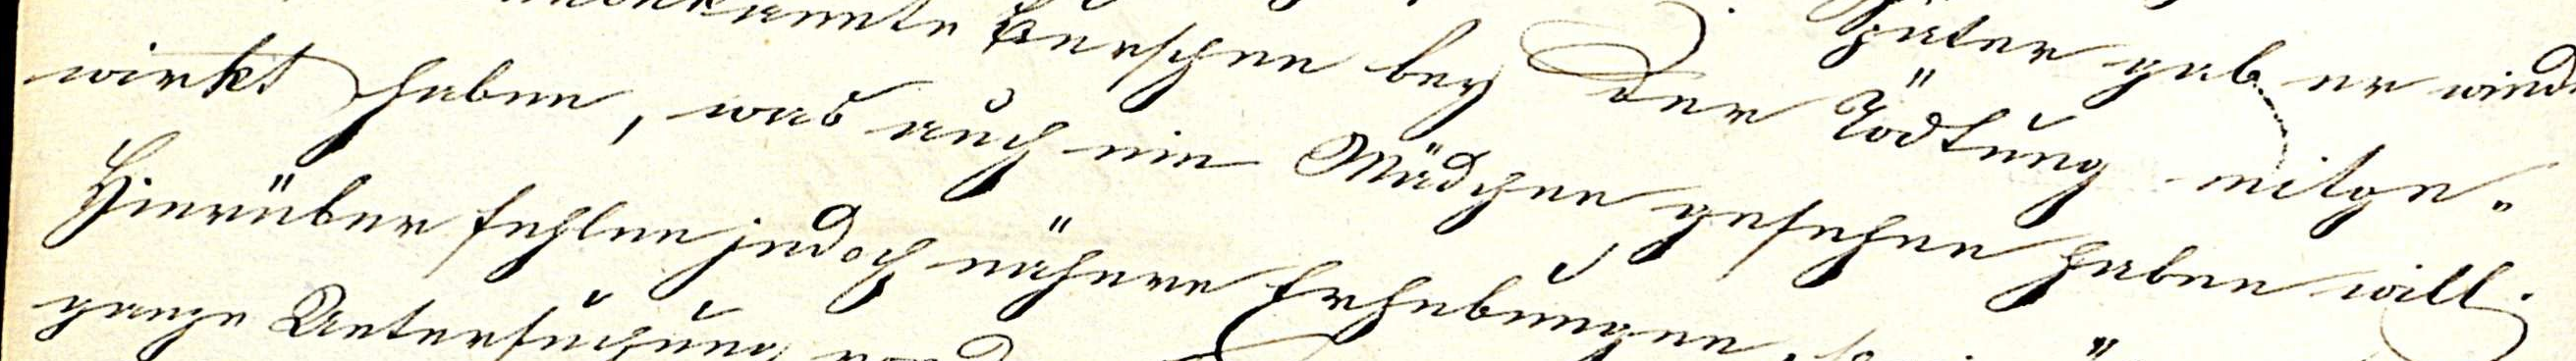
wirkt haben, was auch ein Mädchen gesehen haben will.
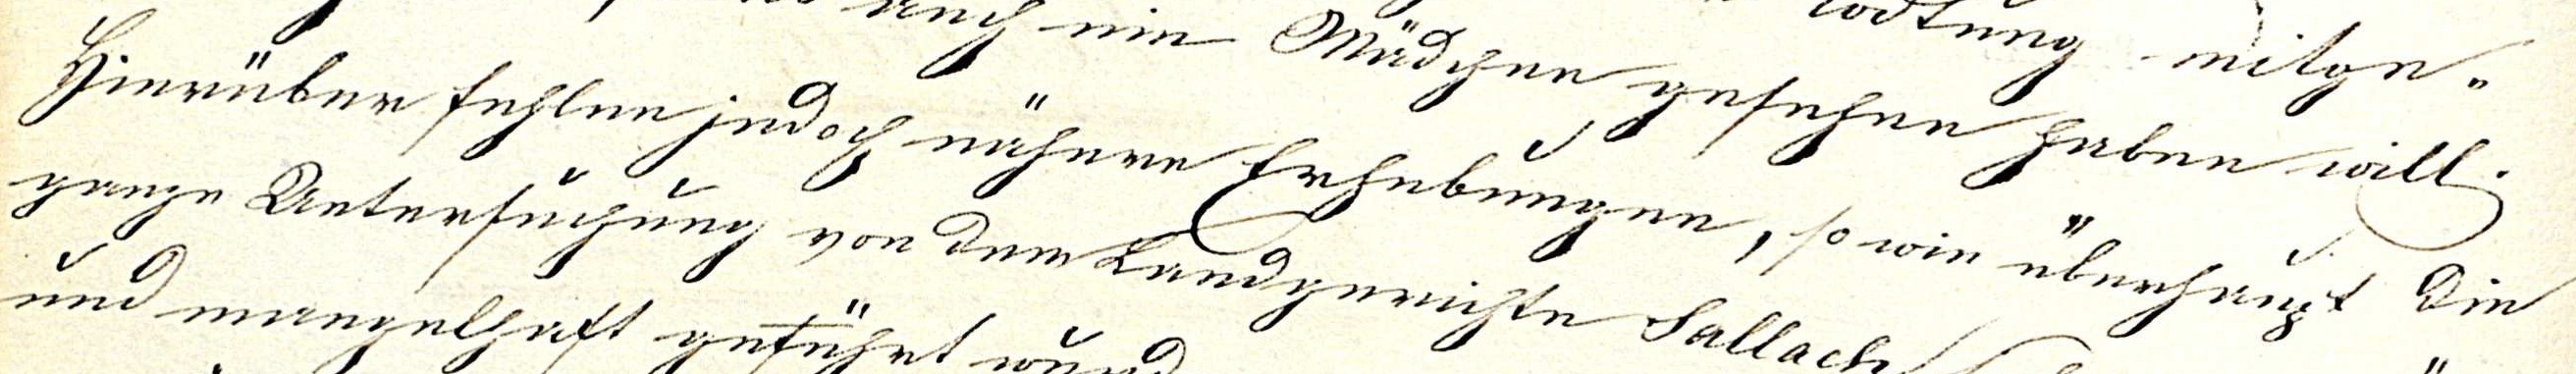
Hierüber fehlen jedoch nähern Erhebungen, so wie überhaupt die
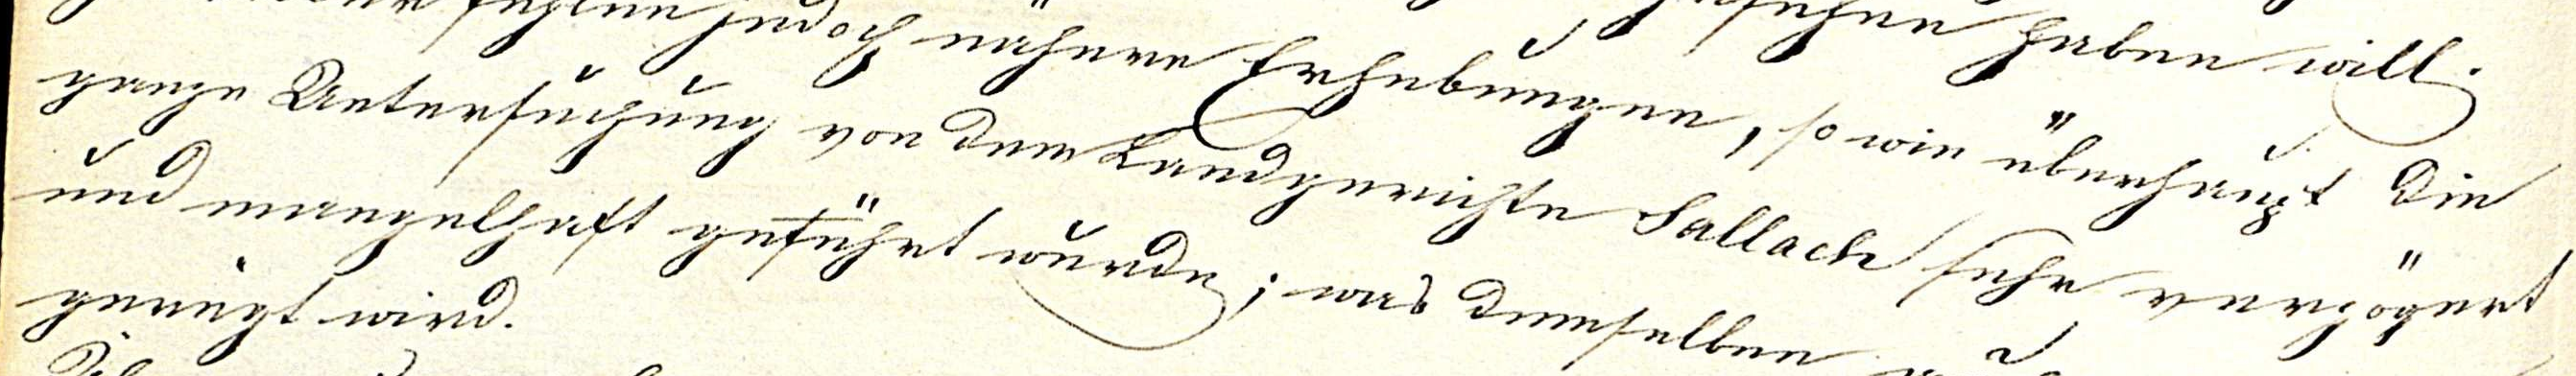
ganze Untersuchung von dem Landgerichte Sallach sehr verzögert
